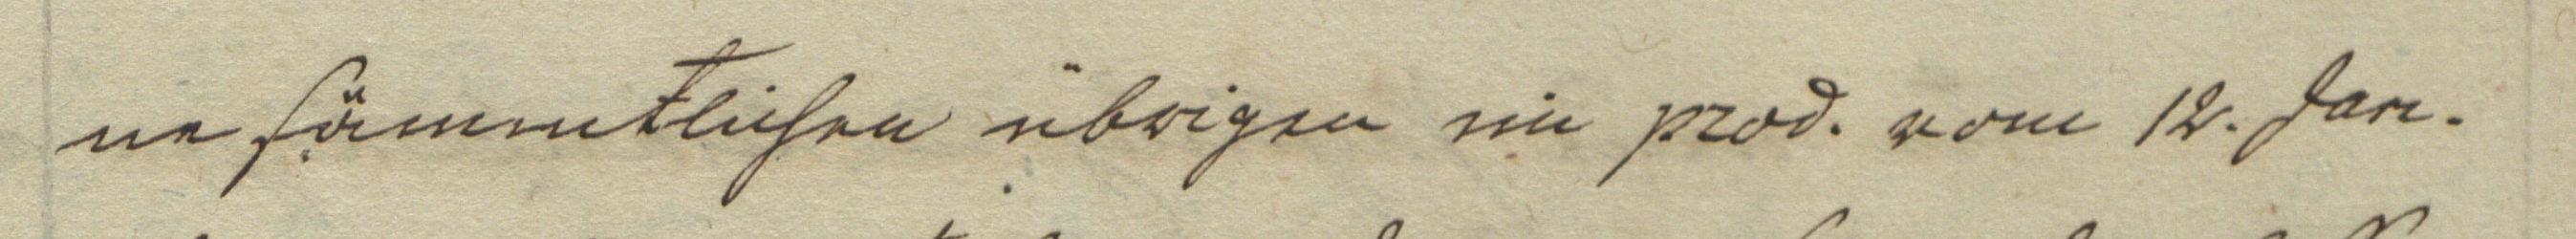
ne sämmtlichen übrigen im prod. vom 12. Jan.
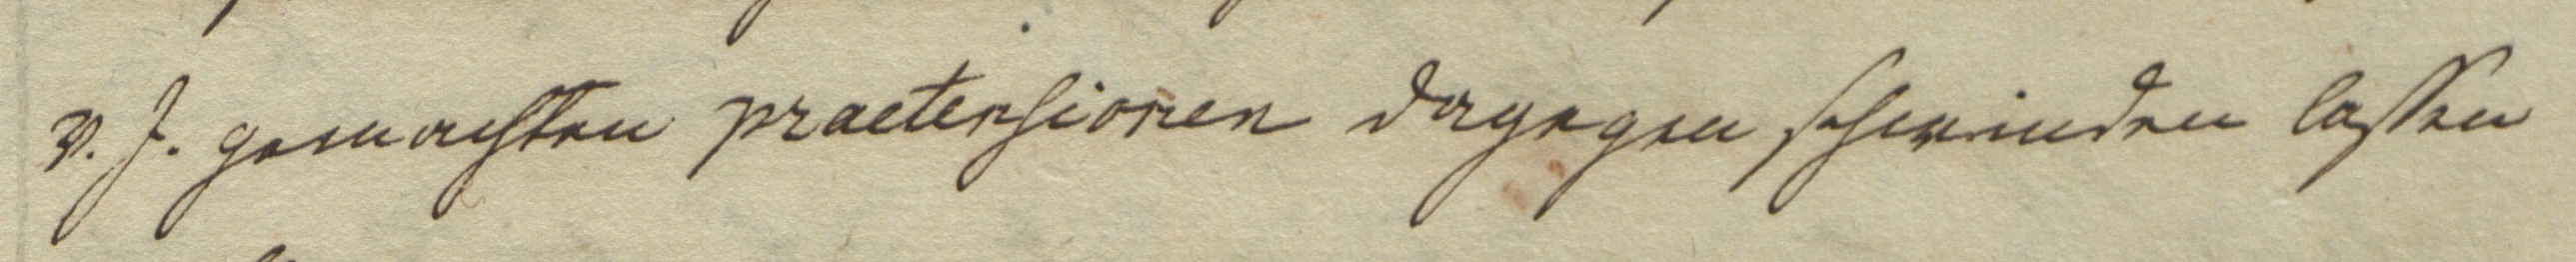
v. J. gemachten praetensionen dagegen schwinden lassen
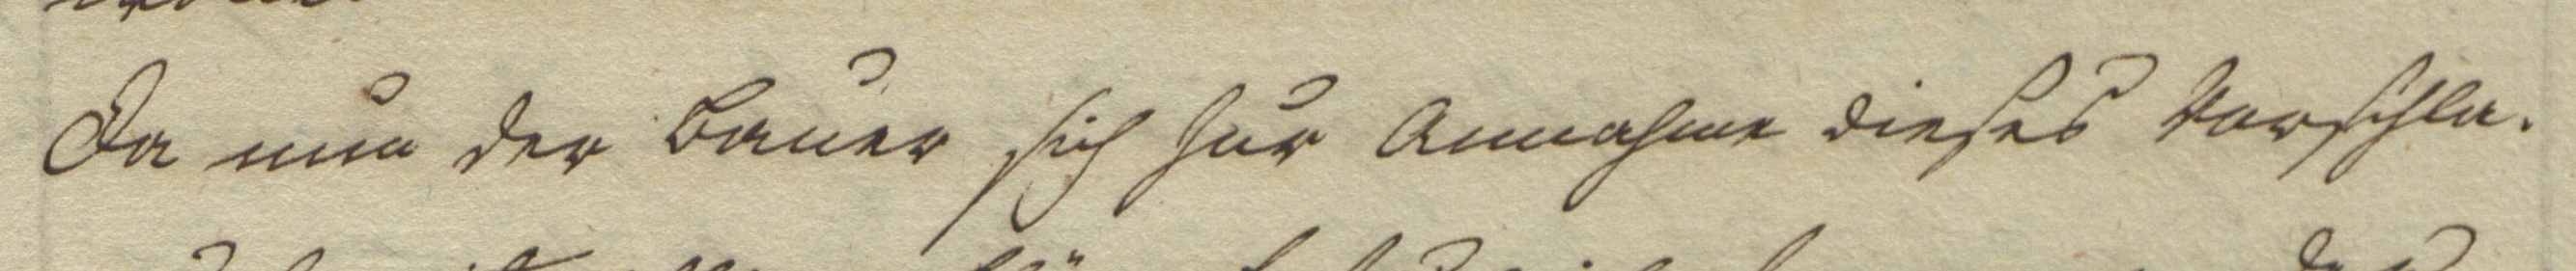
Da nun der Bauer sich zur Annahme dieses Vorschla¬
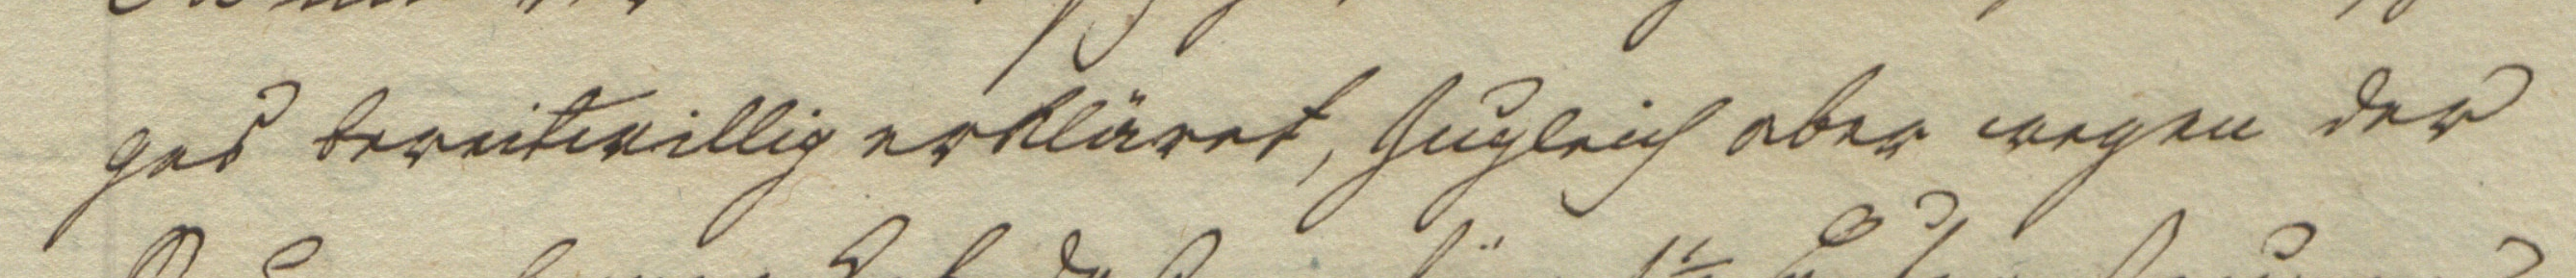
ges bereitwillig erkläret, zugleich aber wegen der
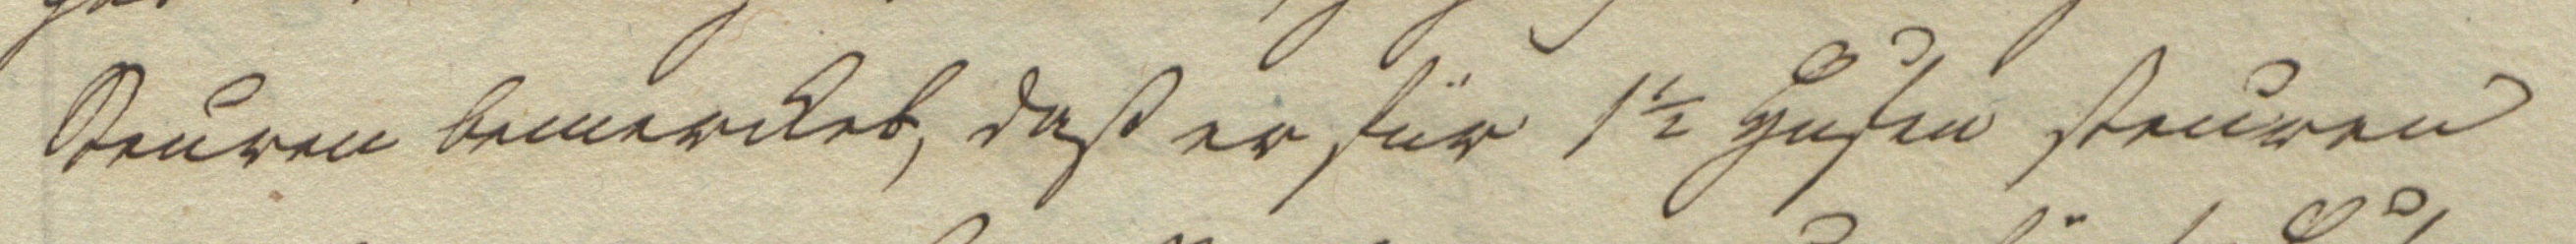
Steuren bemercket, daß er für 1½ Hufen steuren
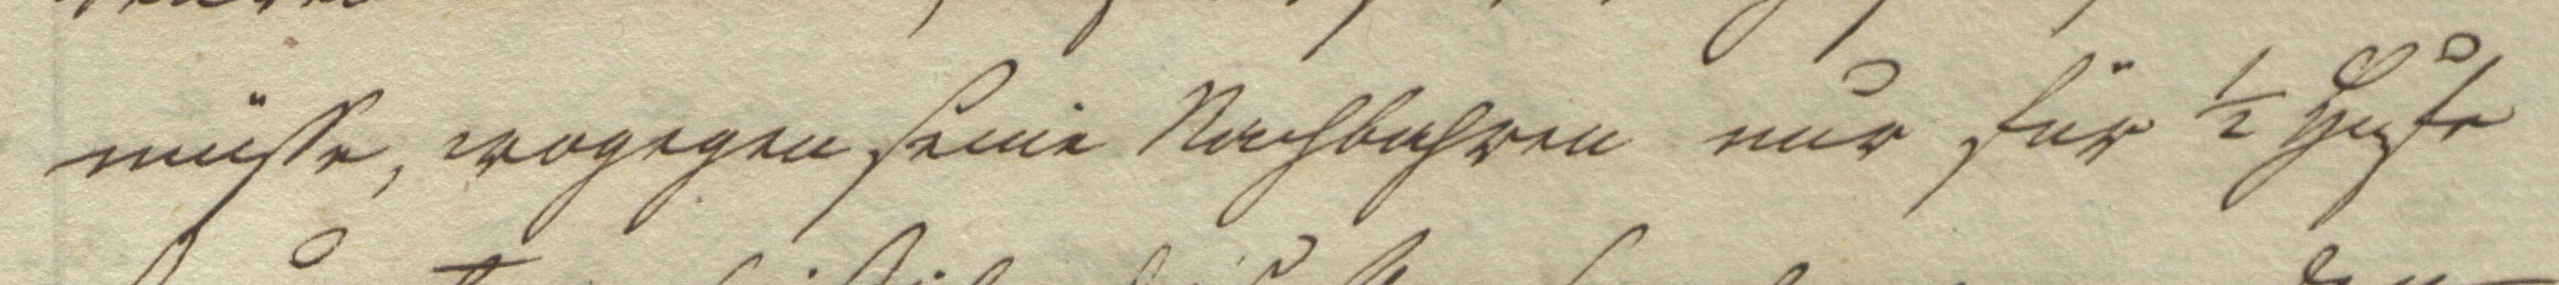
müsse, wogegen seine Nachbahren nur für ½ Hufe
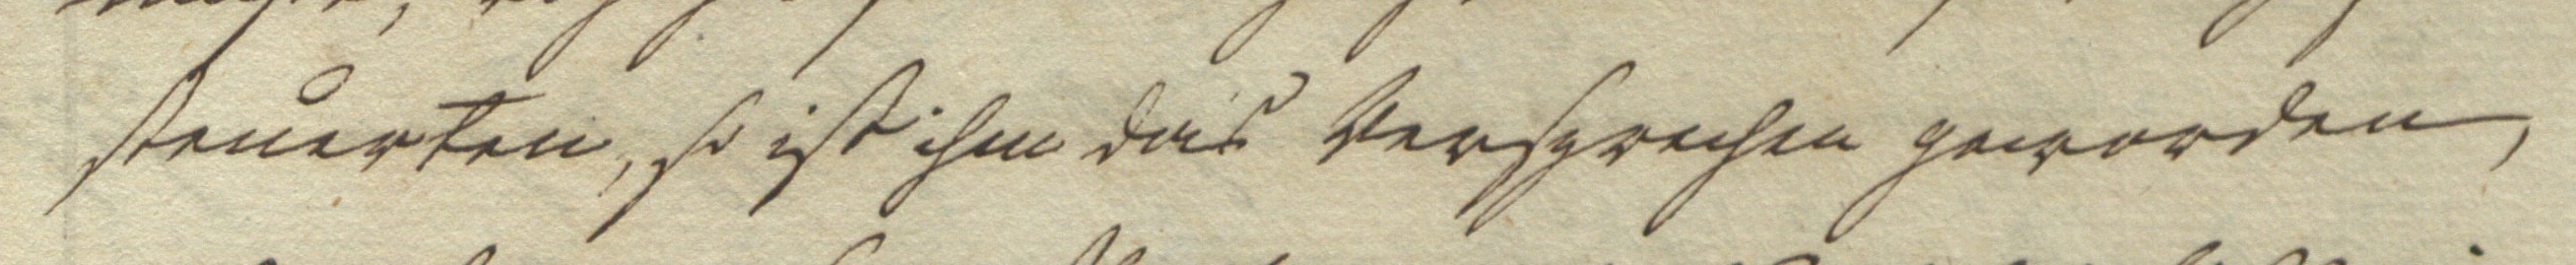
steuerten, so ist ihm das Versprechen geworden,
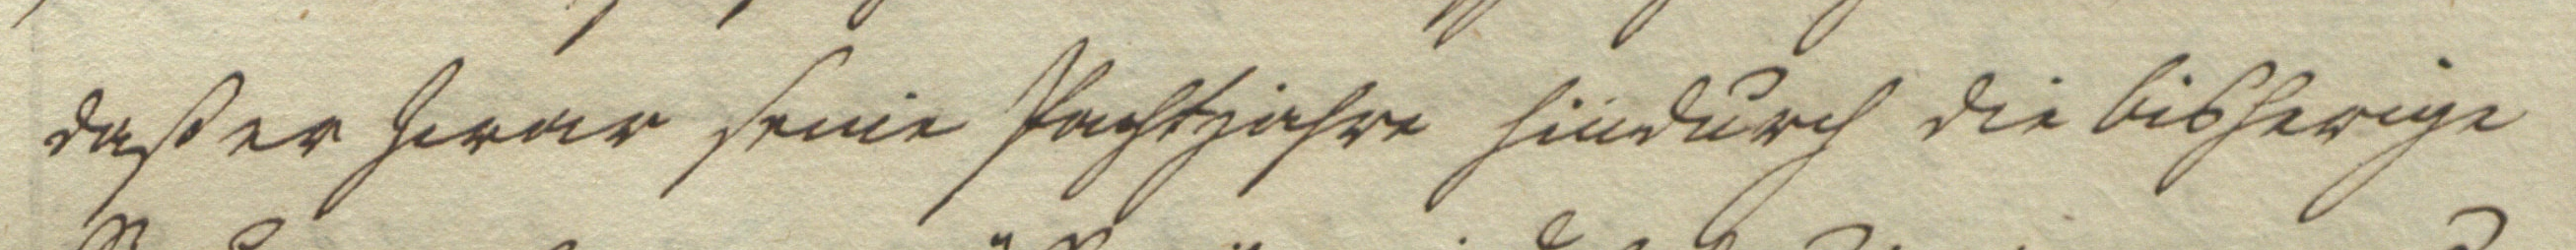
daß er zwar seine Pachtjahre hindurch die bisherige
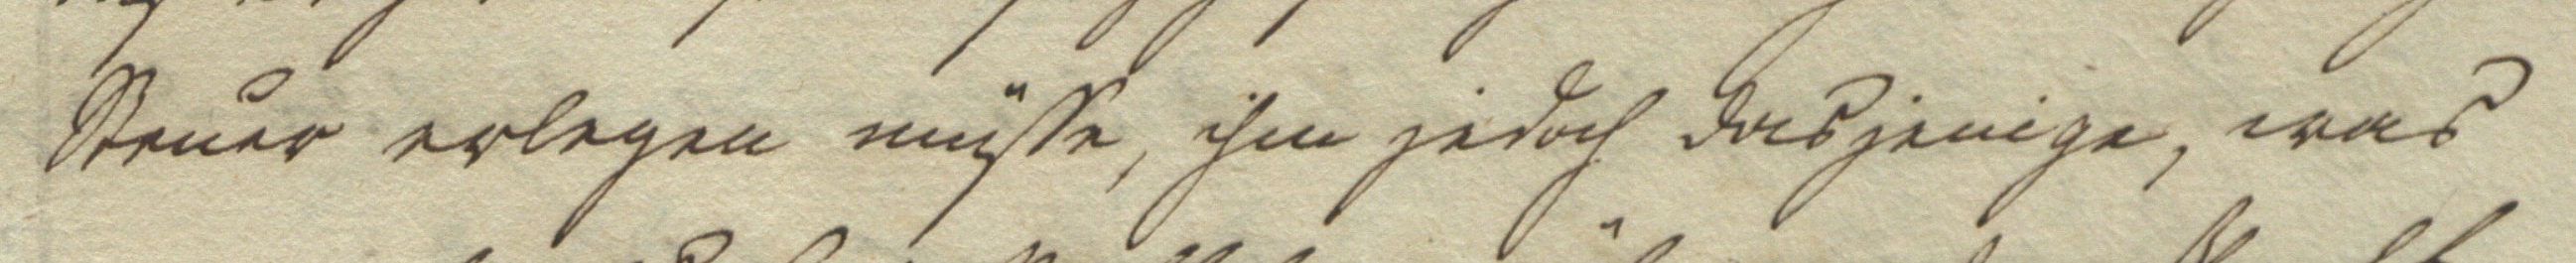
Steuer erlegen müsse, ihm jedoch dasjenige, was
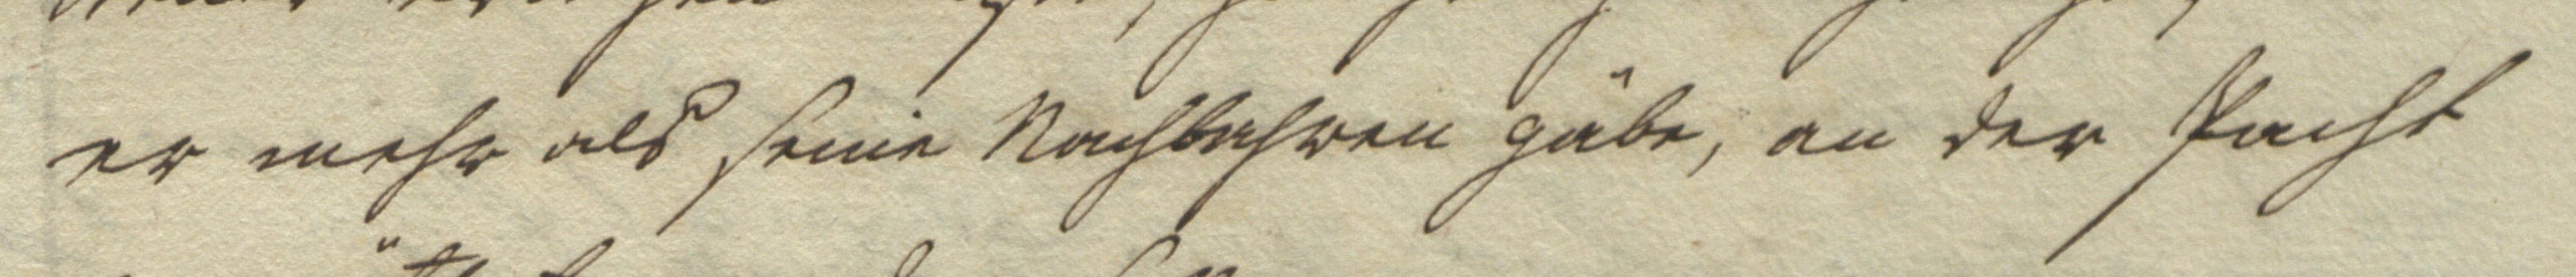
er mehr als seine Nachbahren gäbe, an der Pacht
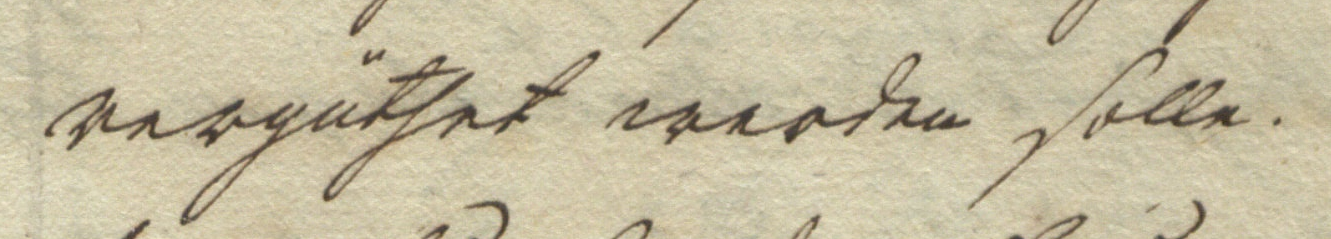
vergüthet werden solle.
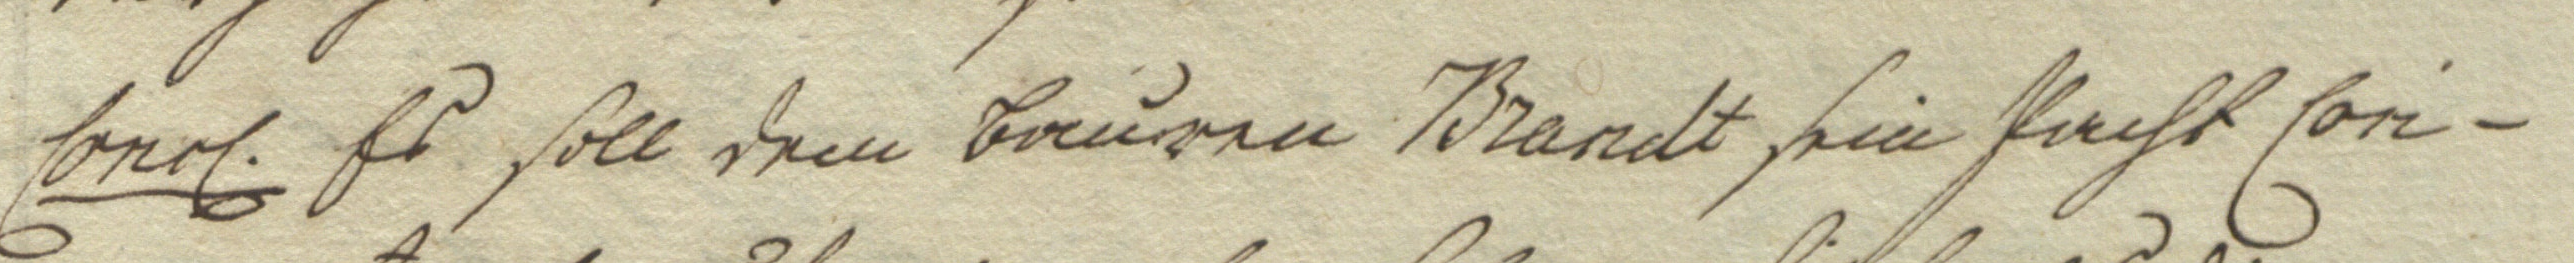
Concl. Es soll dem Bauren Brandt sein Pacht Con-
